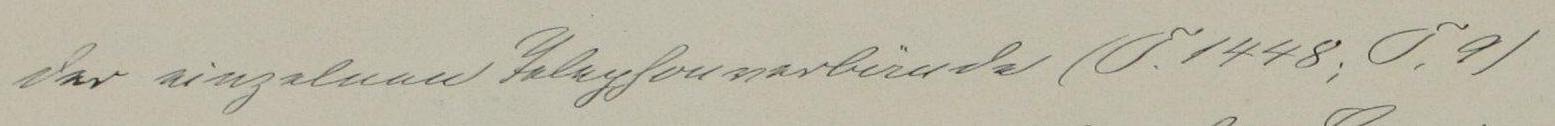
der einzelnen Telephonverbände (T.1448; T.9)
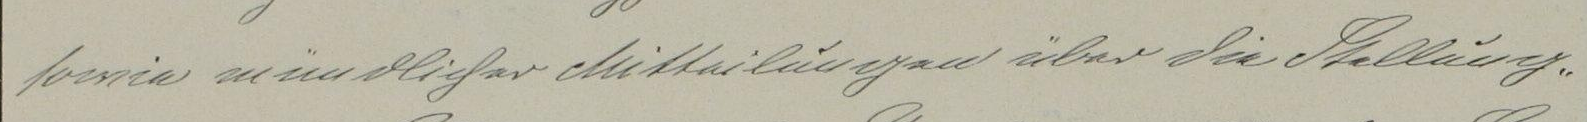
sowie mündlicher Mitteilungen über die Stellung-
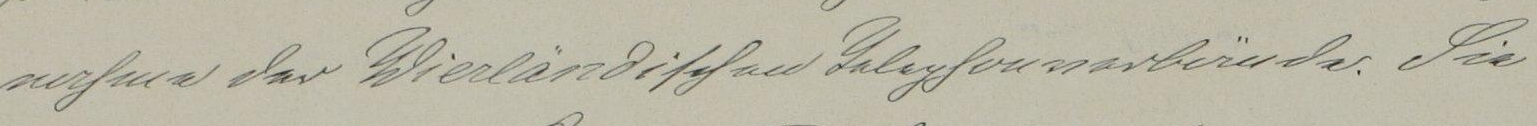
nahme der Wierländischen Telephonverbände. Sie
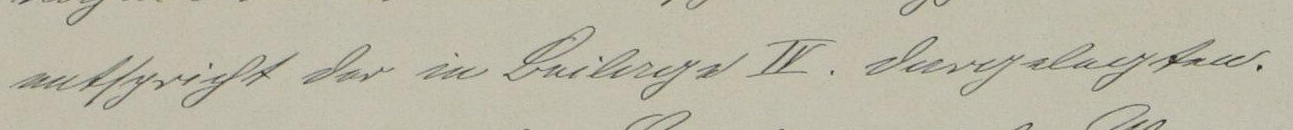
entspricht der in Beilage IV. dargelegten.
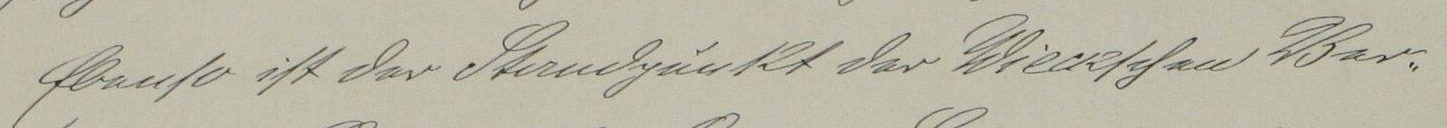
Ebenso ist der Standpunkt der Wieckschen Ver-
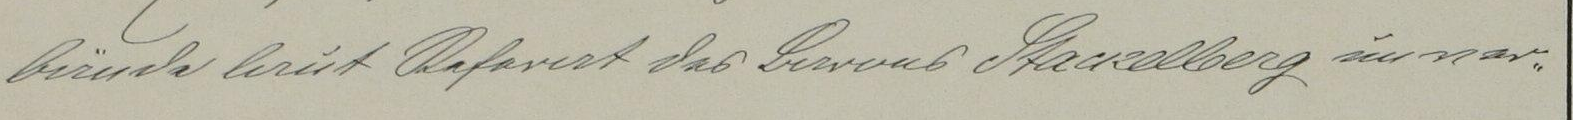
bände laut Referat des Barons Stackelberg unver-
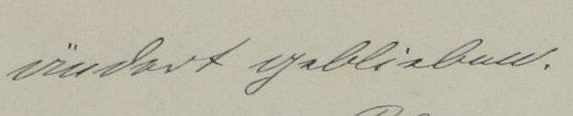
ändert geblieben.
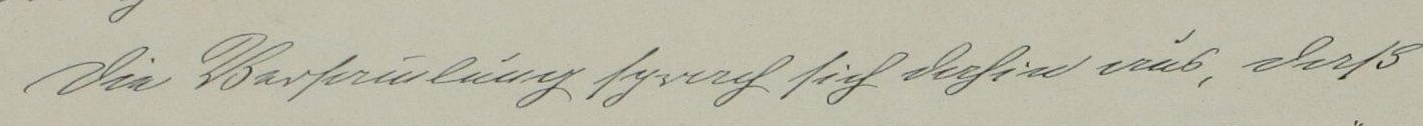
Die Versammlung sprach sich dahin aus, daß
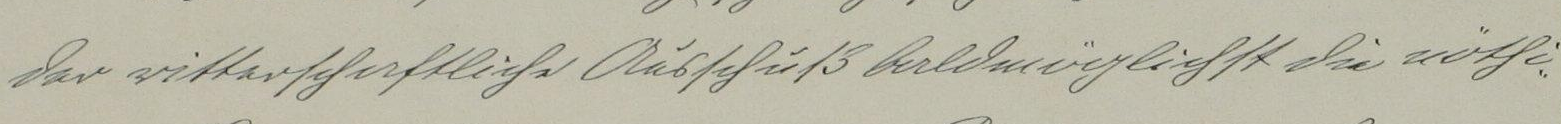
der ritterschaftliche Ausschuß baldmöglichst die nöthi-
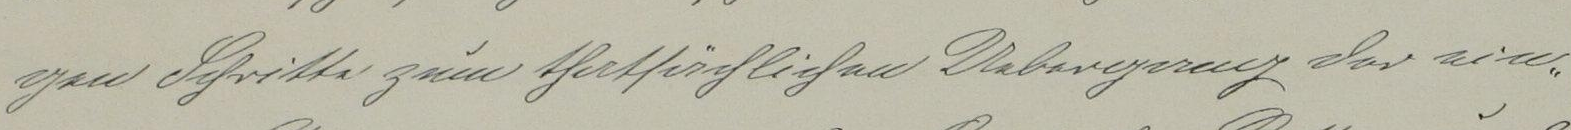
gen Schritte zum thatsächlichen Uebergang der ein-
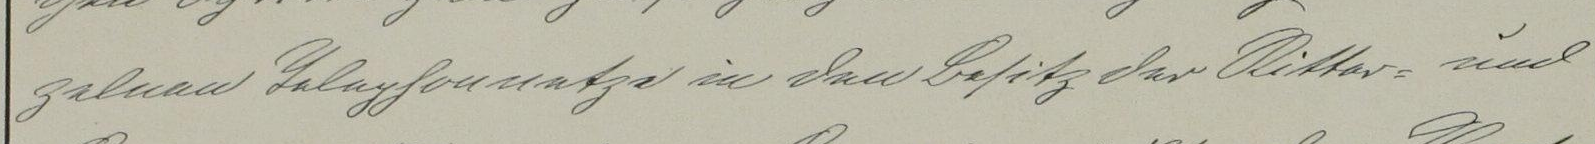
zelnen Telephonnetze in den Besitz der Ritter- und
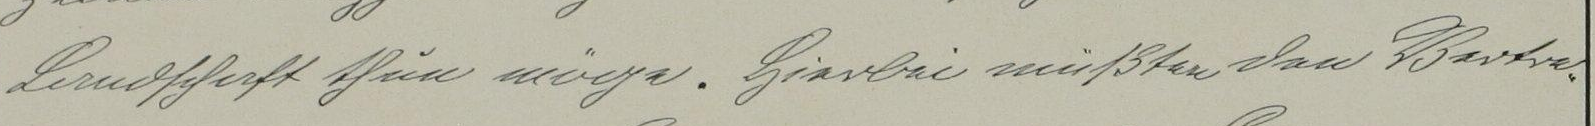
Landschaft thun möge. Hierbei müßten den Vertre-
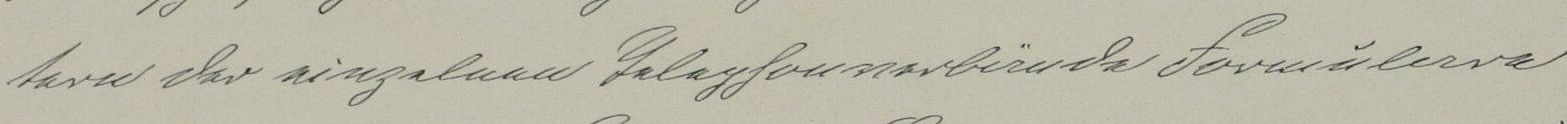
tern der einzelnen Telephonverbände Formulare
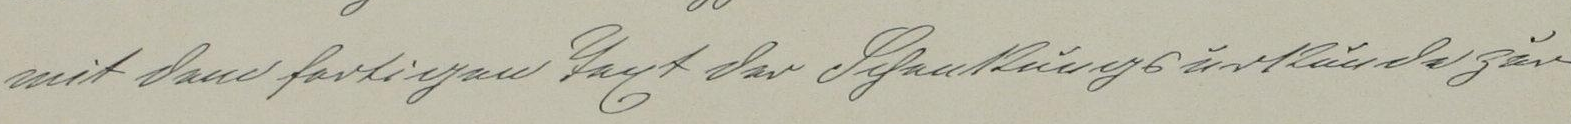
mit dem fertigen Text der Schenkungsurkunde zur
